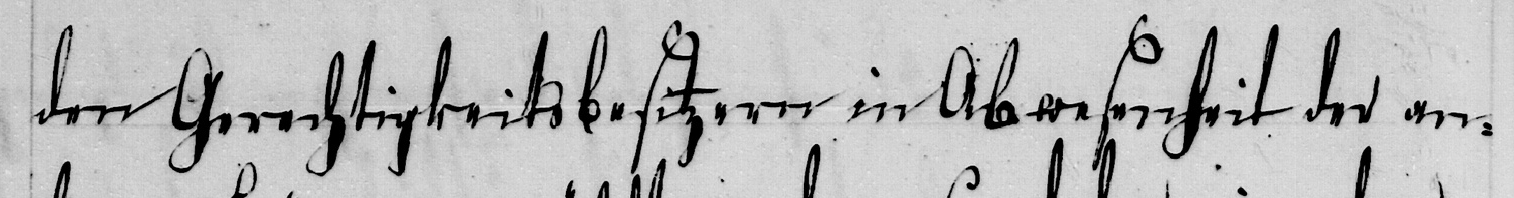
den Gerechtigkeitsbesitzern in Abwesenheit der an¬
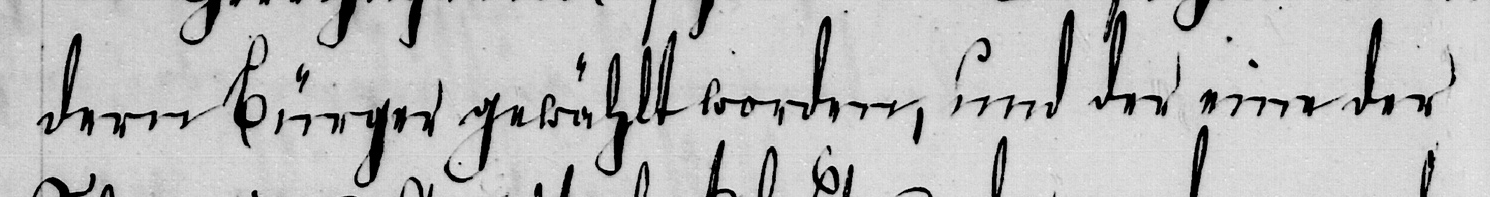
dern Bürger gewählt worden, und der eine der
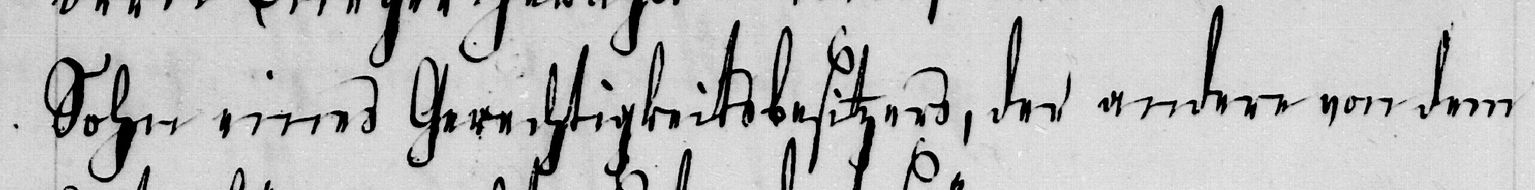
Sohn eines Gerechtigkeitsbesitzers, der andere von dem
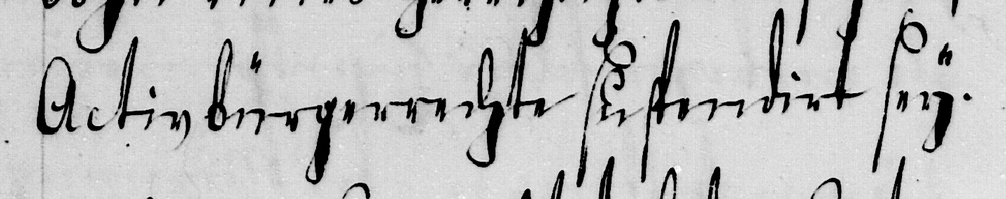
Activbürgerrechte suspendirt sey.
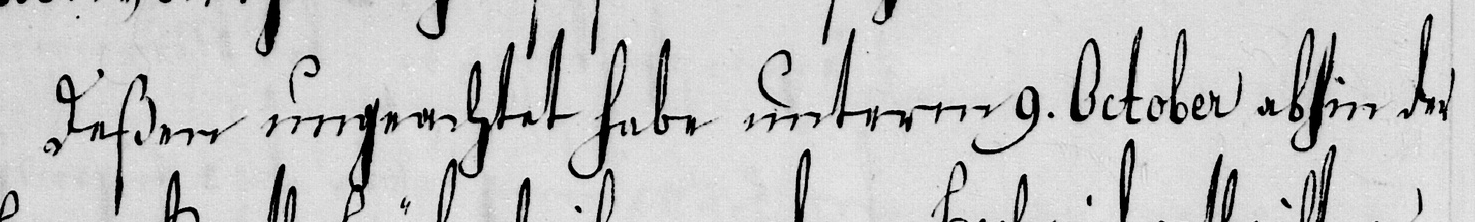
Deßen ungeachtet habe unterm 9. October abhin d¬
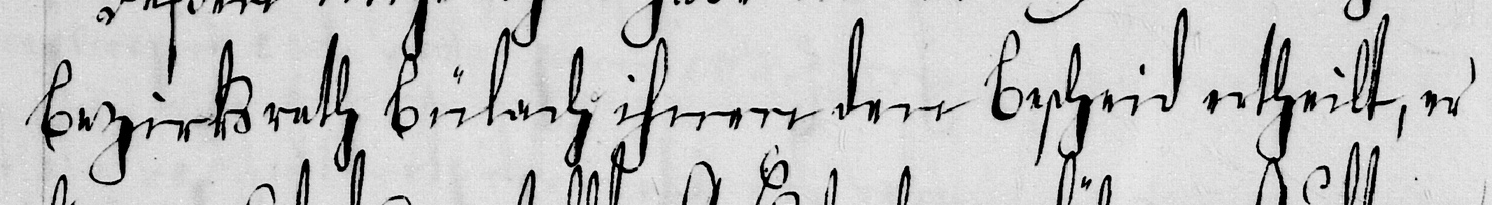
Bezirksrath Bülach ihnen den Bescheid ertheilt, er
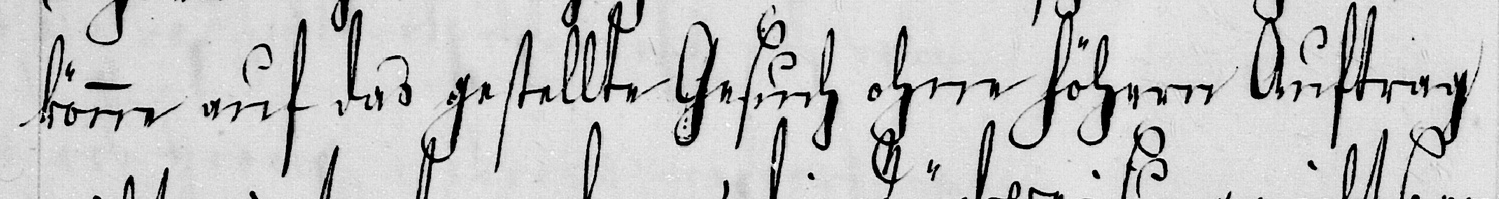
könne auf das gestellte Gesuch ohne Höhern Auftrag
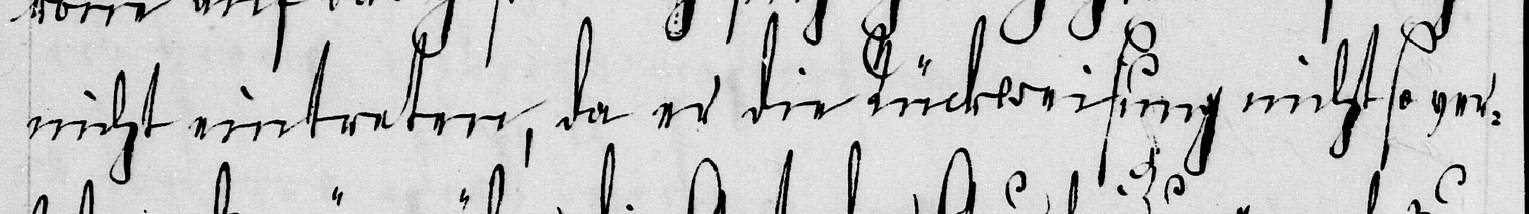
nicht eintreten, da er die Rückweisung nicht so ver¬
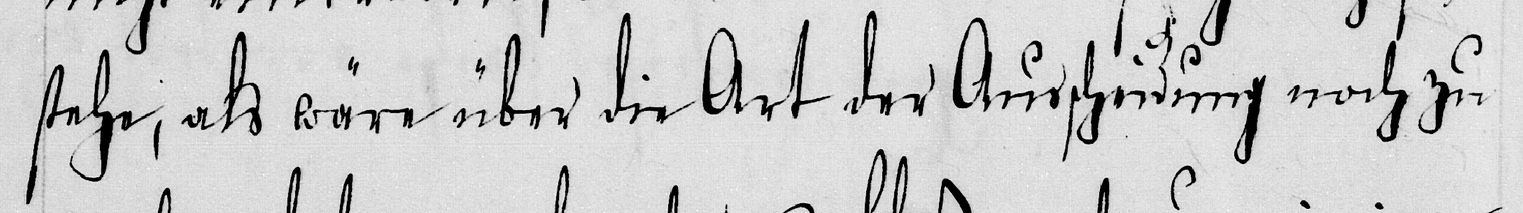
stehe, als wäre über die Art der Ausscheidung noch zu
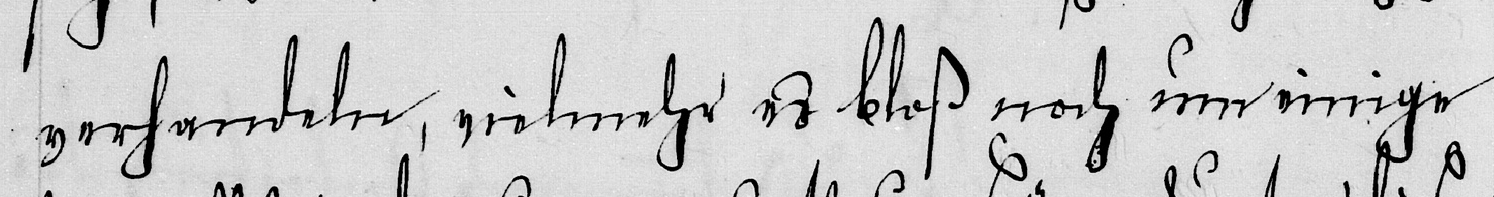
verhandeln, vielmehr es bloß noch um einige
